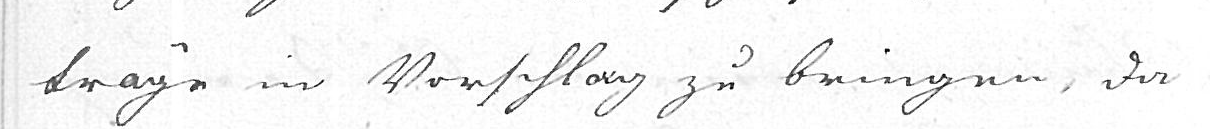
träge in Vorschlag zu bringen, da
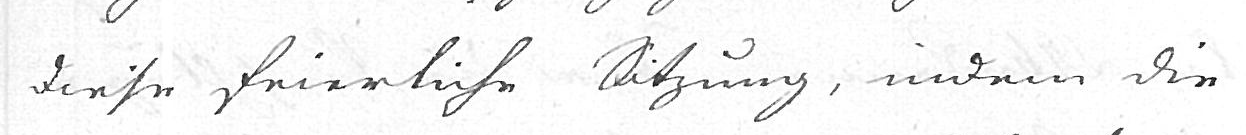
diese feierliche Sitzung, indem die
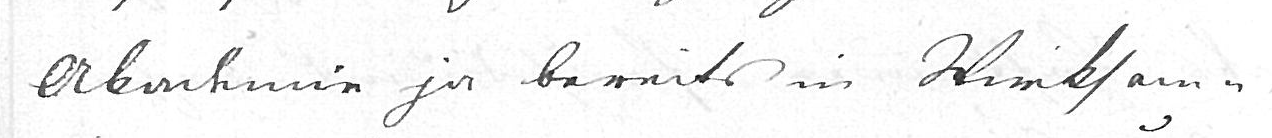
Akademie ja bereits in Wirksam-
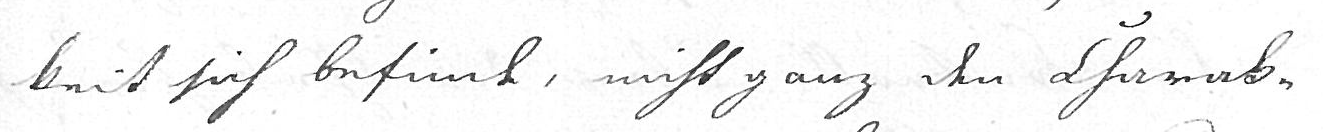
keit sich befindet, nicht ganz den Charak-
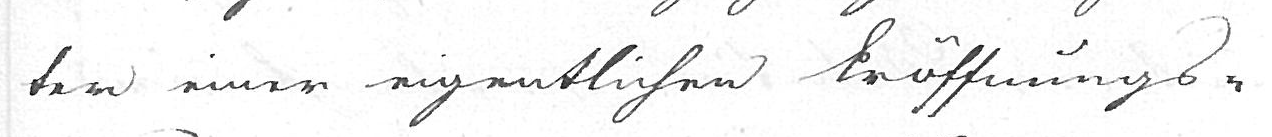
ter einer eigentlichen Eröffnungs-
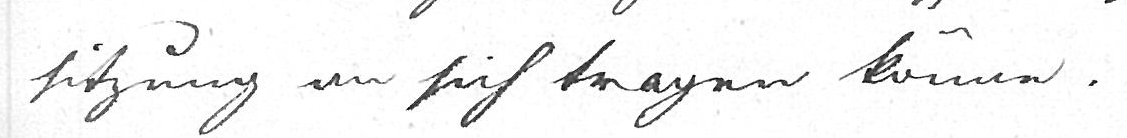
sitzung an sich tragen könne.
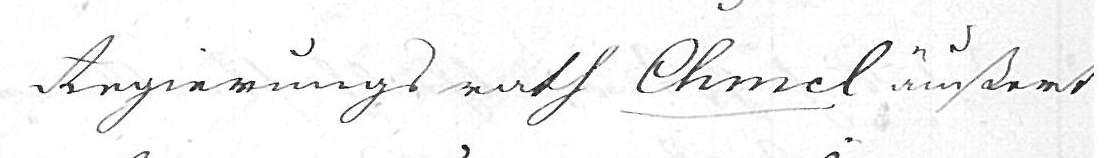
Regierungsrath Chmel äußert
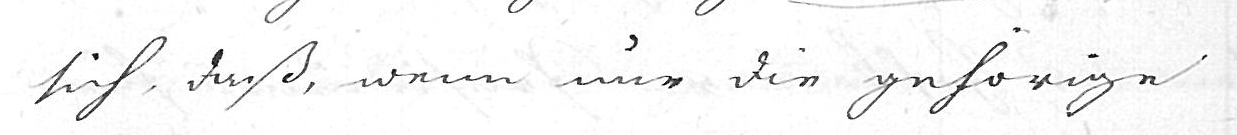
sich, daß, wenn nur die gehörige
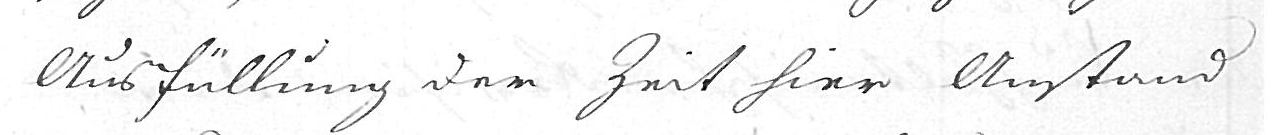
Ausfüllung der Zeit hier Anstand
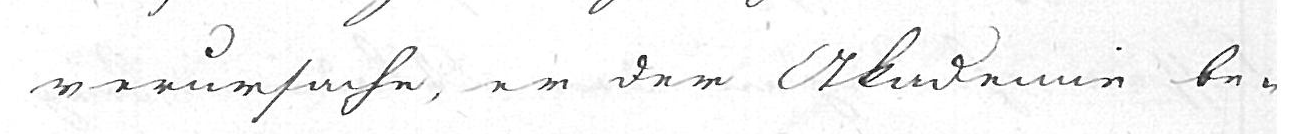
verursache, er der Akademie be-
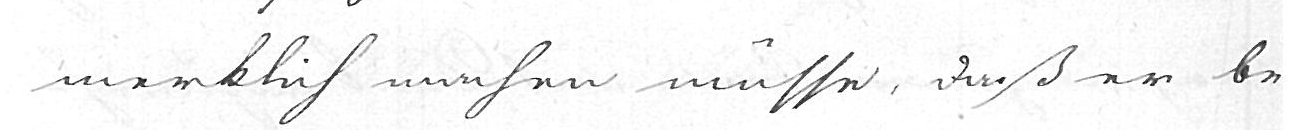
merklich machen müsse, daß er be-
